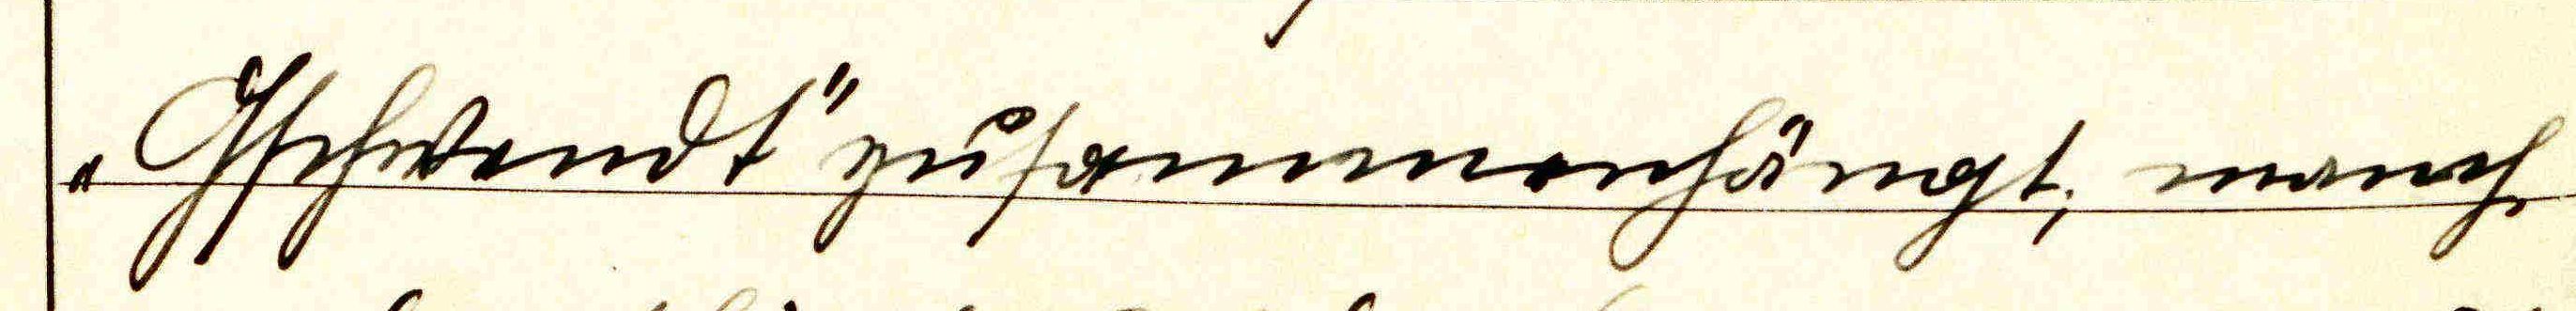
Bssohtens" gussamas legte mag
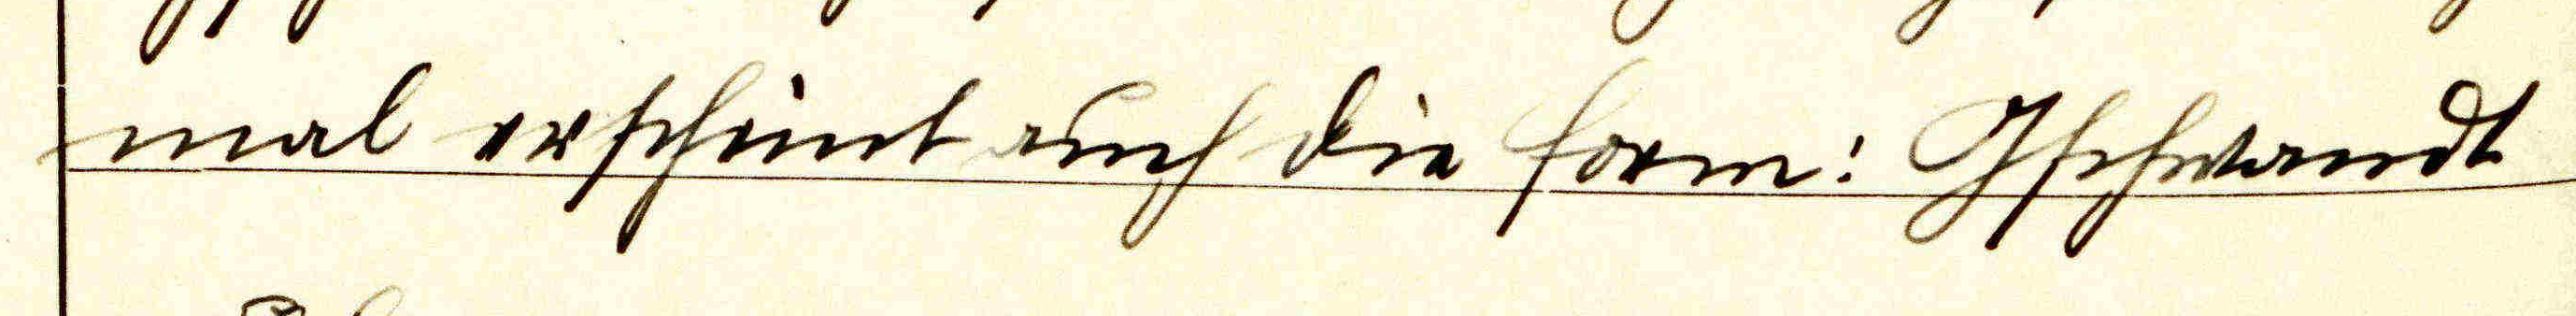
Emil iesstint auch die Eanftrond.
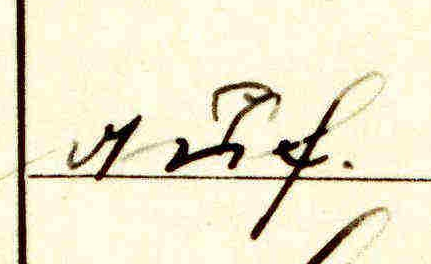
auch.
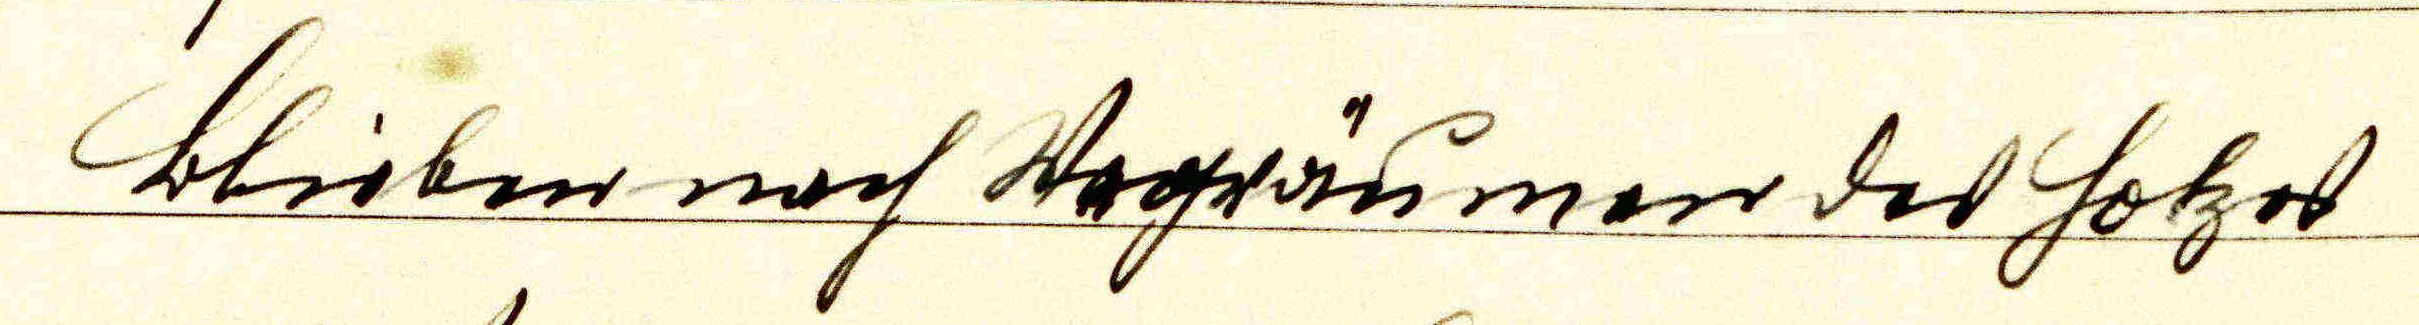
Cibmaf egrauege die setzt
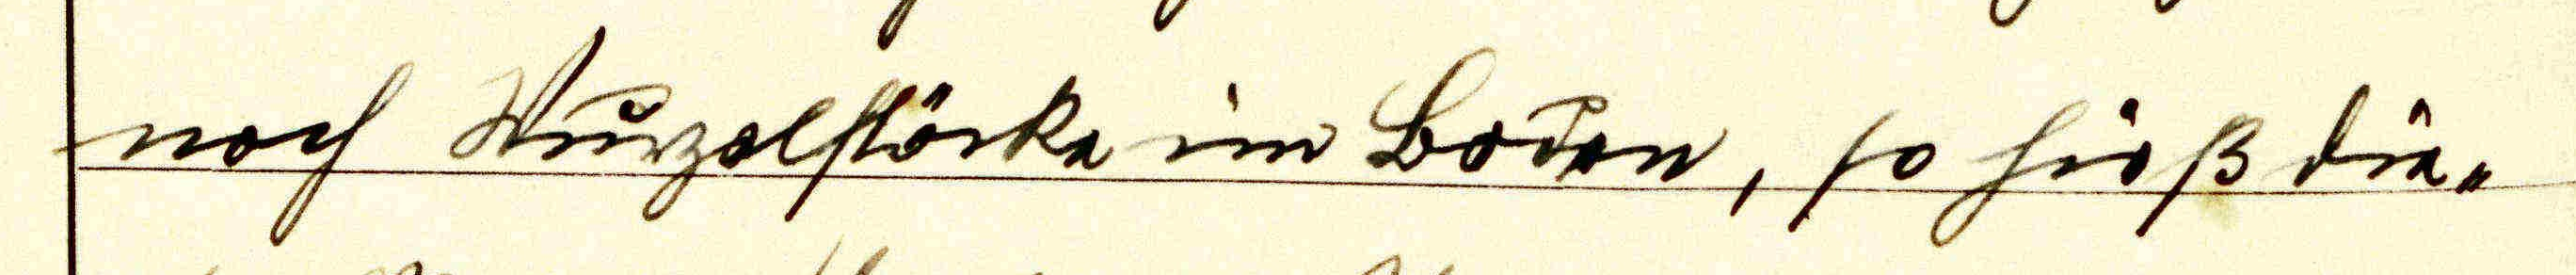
nach Bzukoikea Boden hat daß der
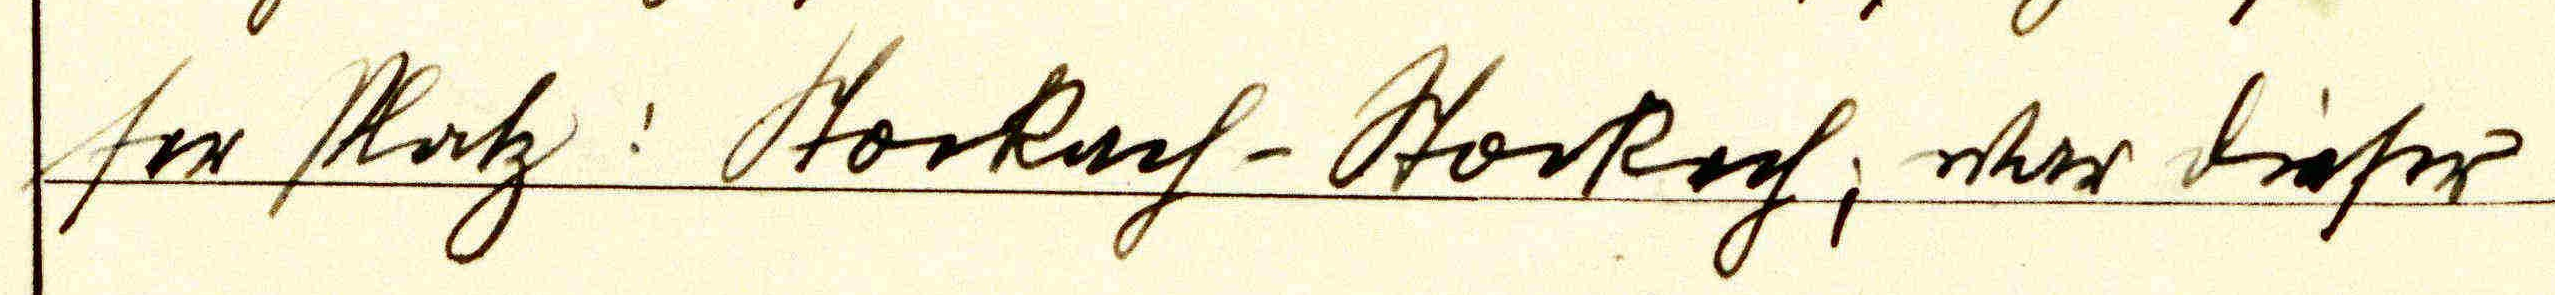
Ersatz Kooech Sotsinch der dieser
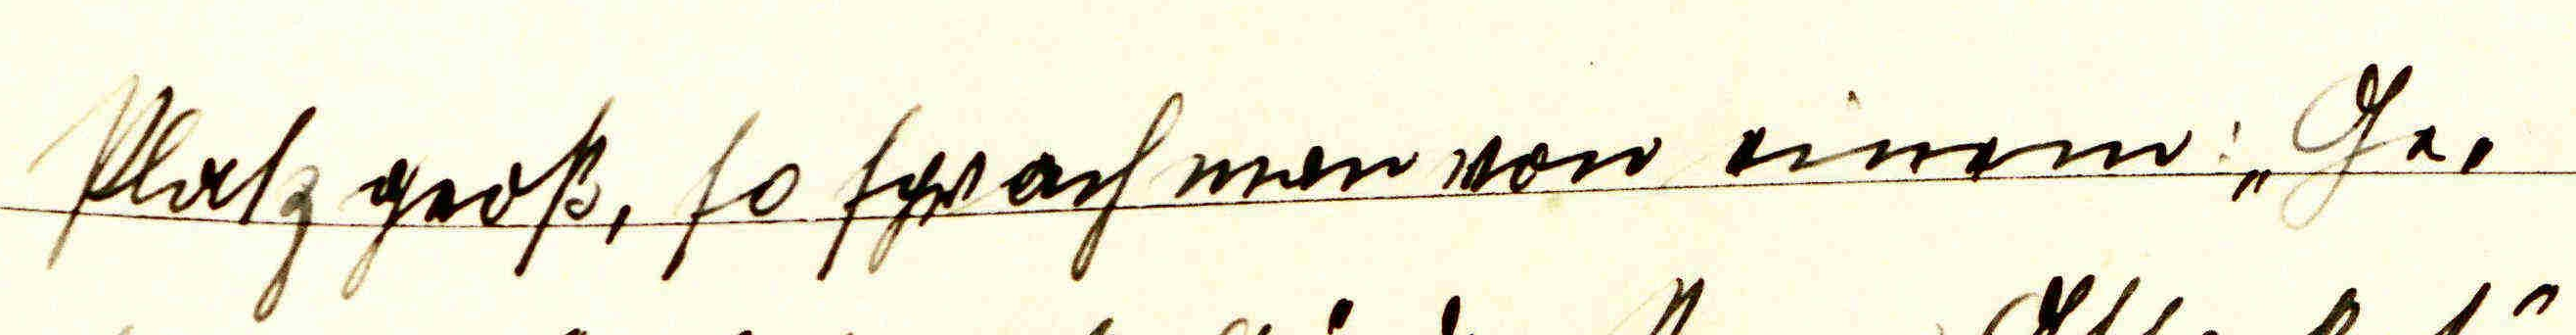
Plätz Jeß, für ftptbachan von Berendes¬
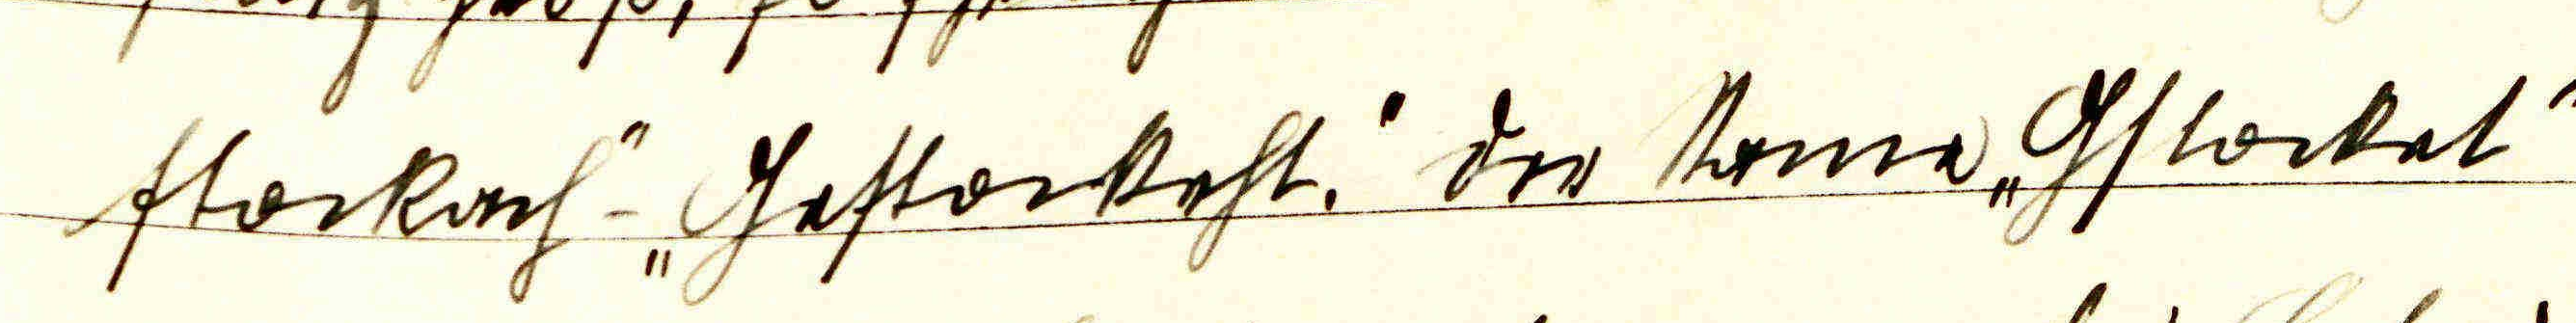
ftockac estokest. Die Konastochet
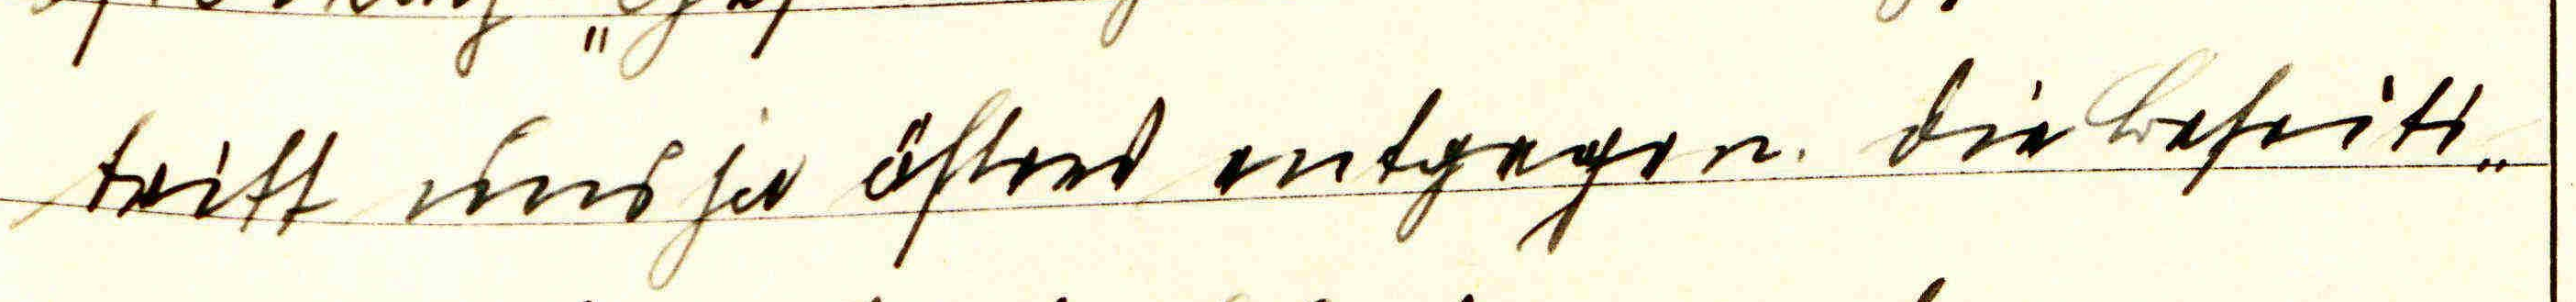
Frist uns in bstrnt entgegen bei Beseitt
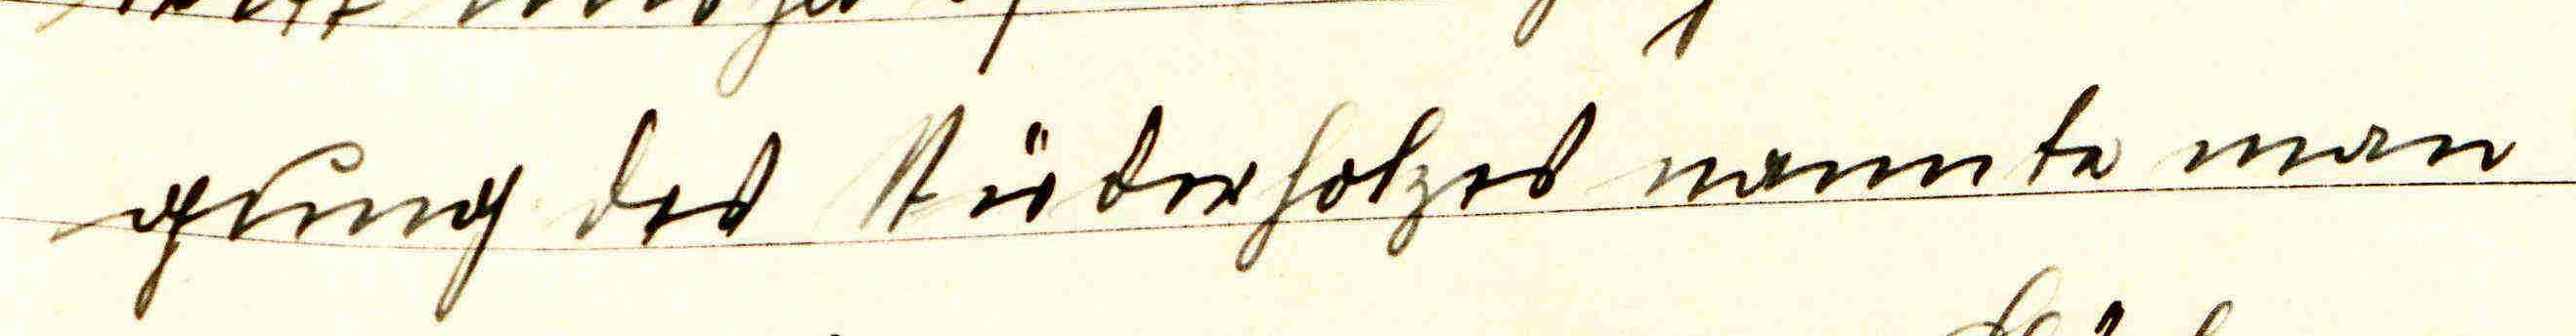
Leistung des ihr hotzeh nahm te man
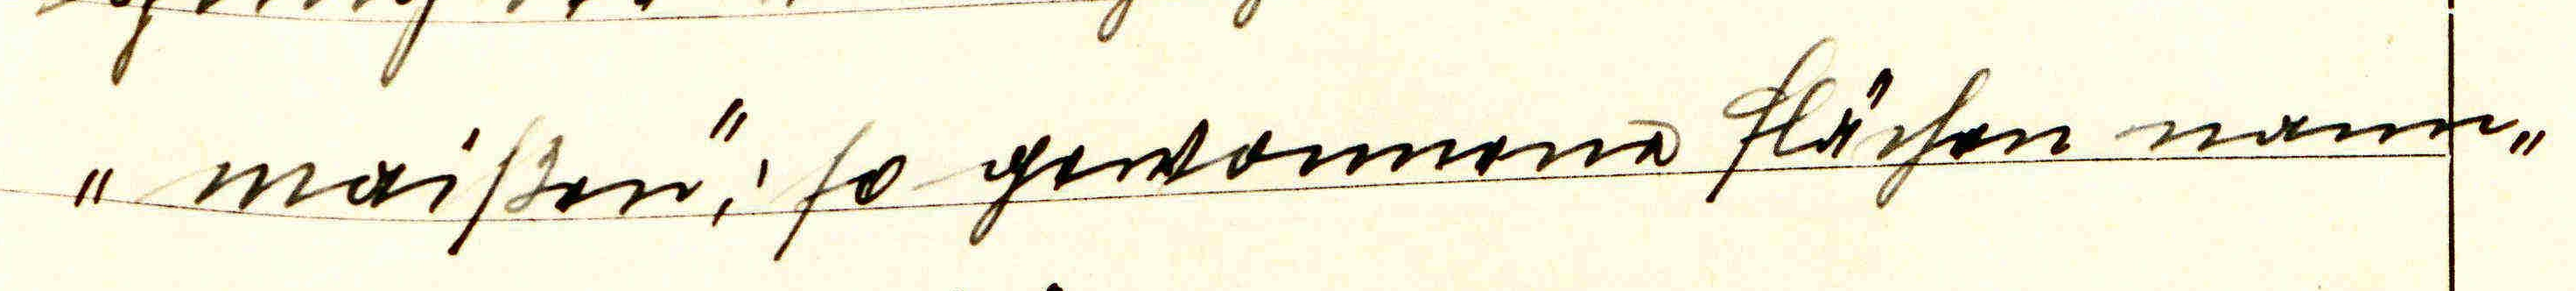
Diesen gekommen diesen genügen
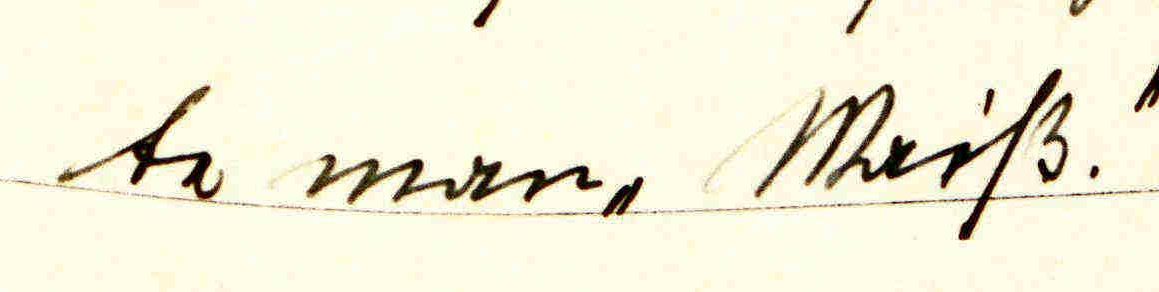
te man Mai¬
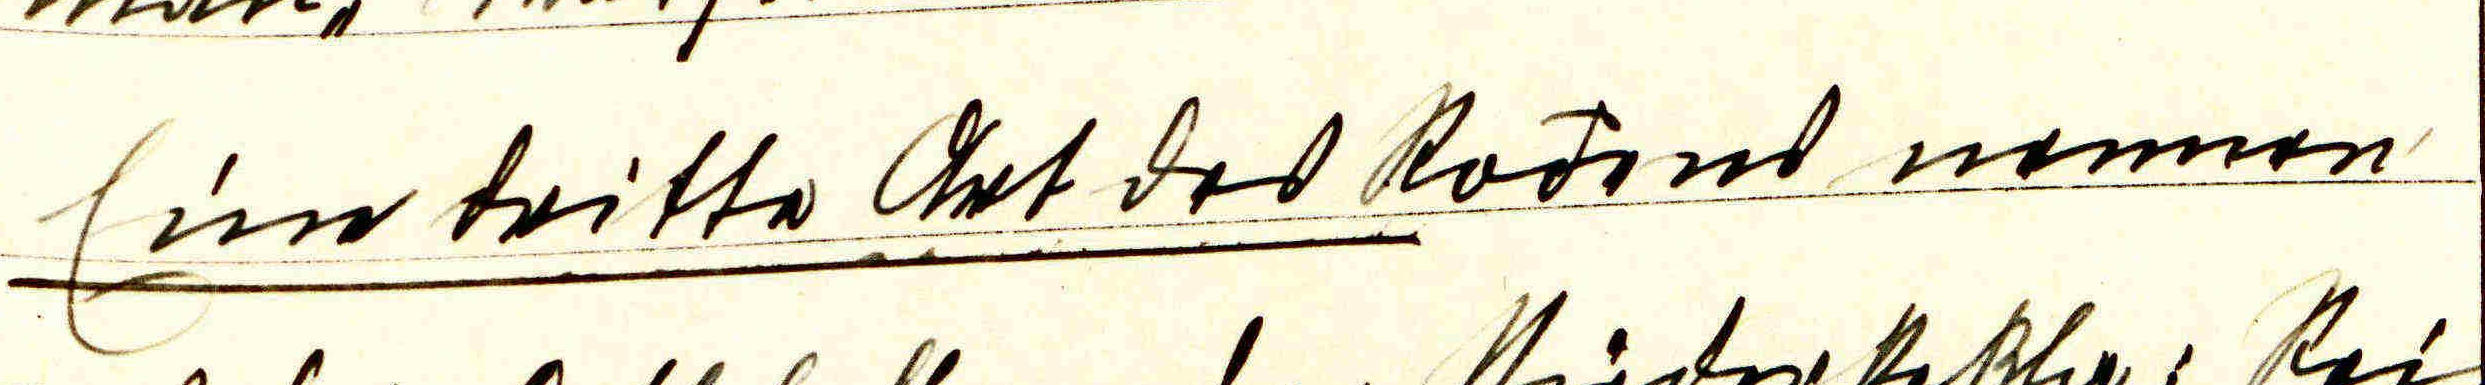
in Seite Geht des recht man
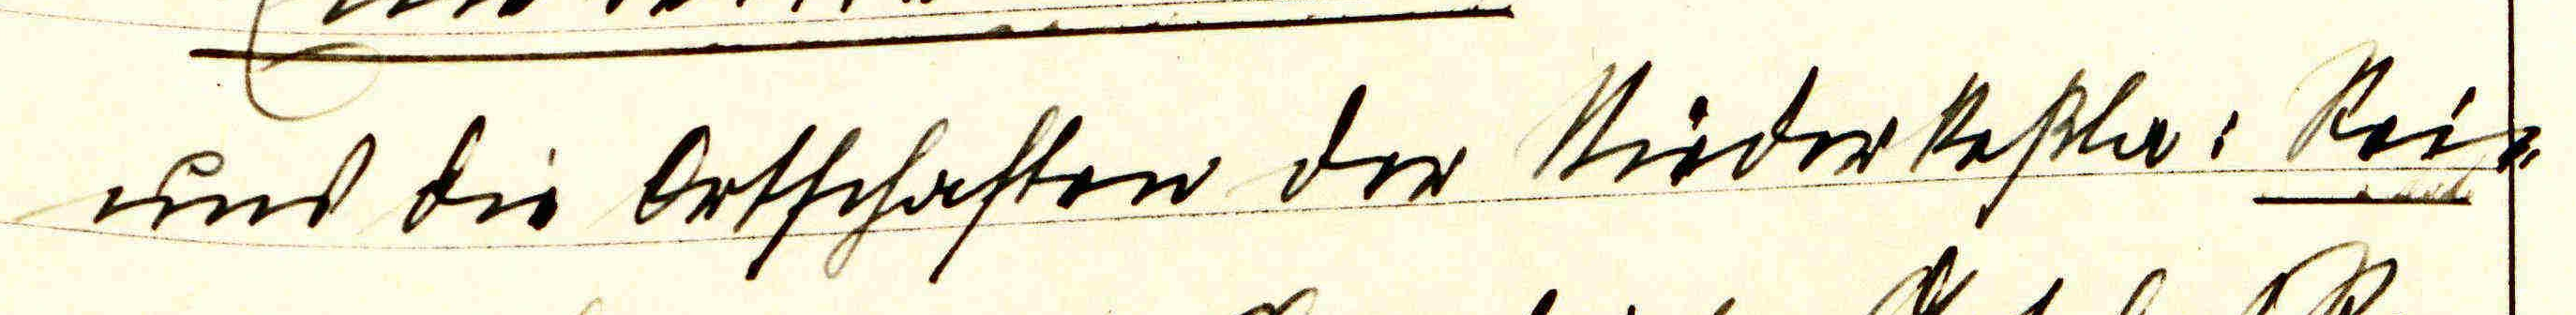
und bei Eetschastm die Seiüdrbeßtan Rechte
